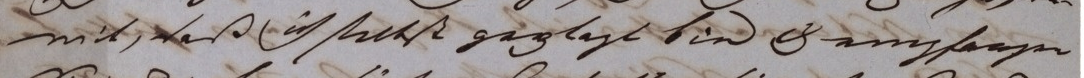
mit, daß ich selbst geplagt bin & empfangen
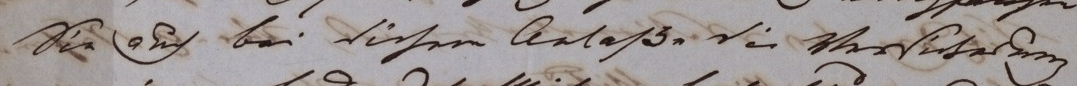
Sie auch bei diesem Anlaße die Versicherung
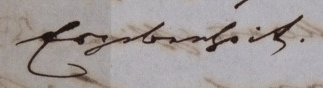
Ergebenheit.
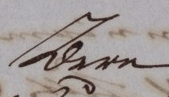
Bern
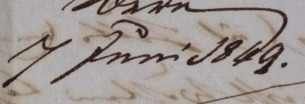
7 Juni 1849.
